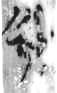貧
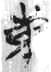東
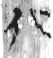北
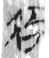高
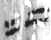二
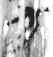方
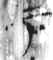下
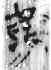黃
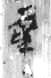帝
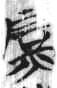庶
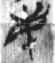民
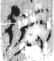凥（居）
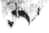之
